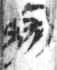眾
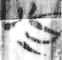必
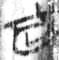或
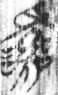○（亂）
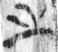之
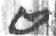㠯（以）
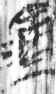堣（寓）
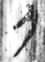人
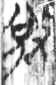敓（奪）
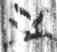之
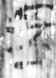室
